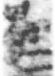○（貍）
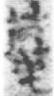○（貘）
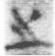之
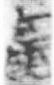聶（攝）
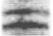二
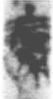○（秦）
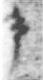弓
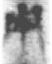用
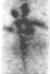矢
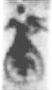○（箙）
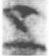五
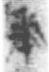秉
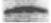一
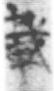載
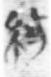紫
